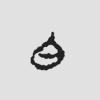白
